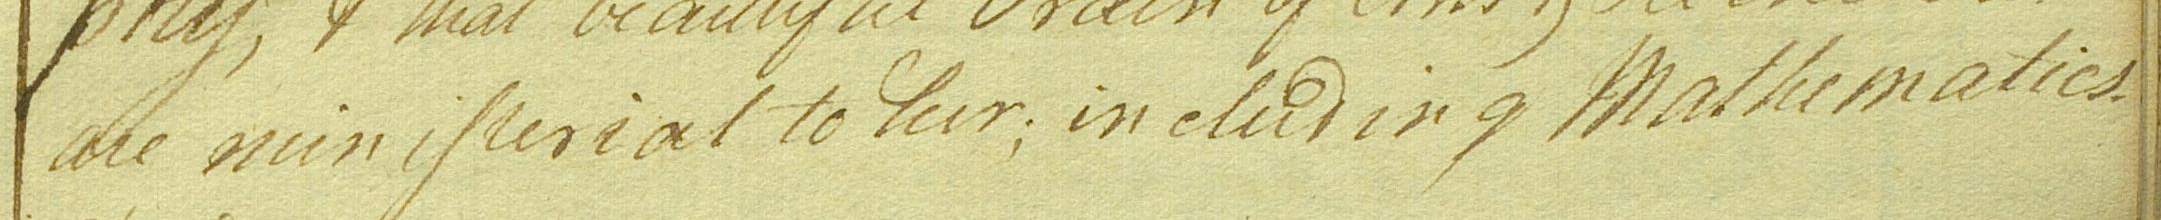are ministerial to her; including Mathematics,
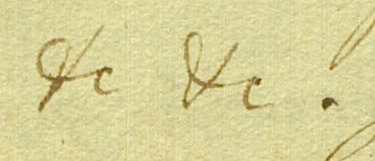&c &c.
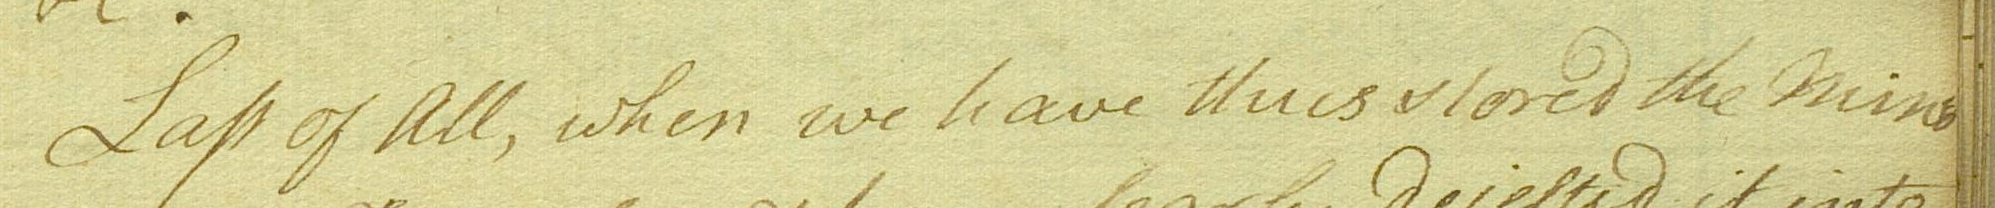Last of All, when we have thus stored the Mind
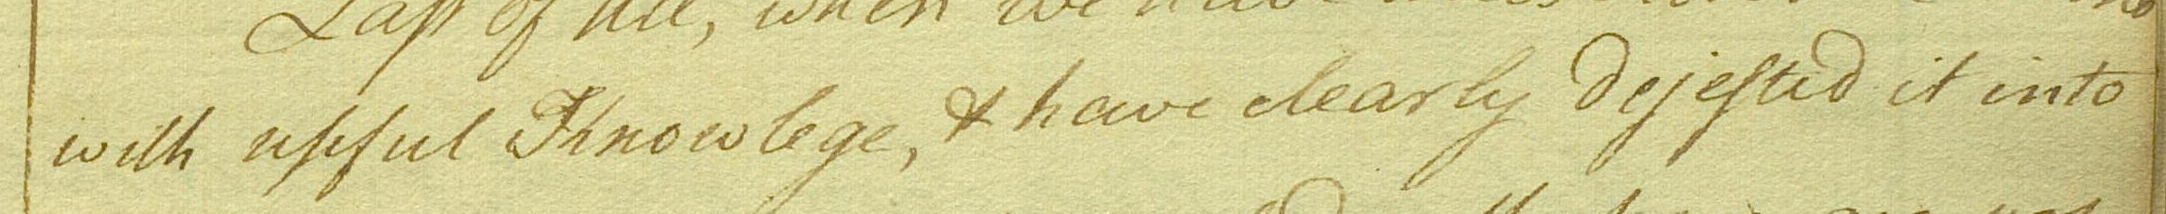with useful Knowledge, & have clearly dejested it into
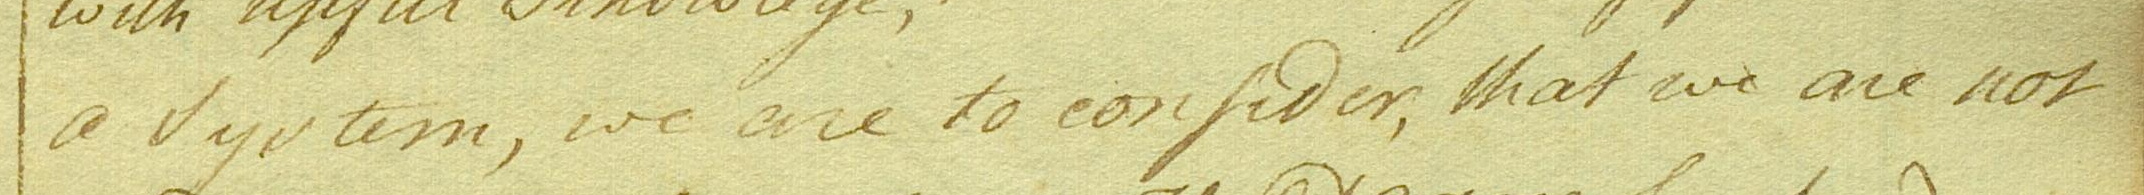a System, we are to consider, that we are not
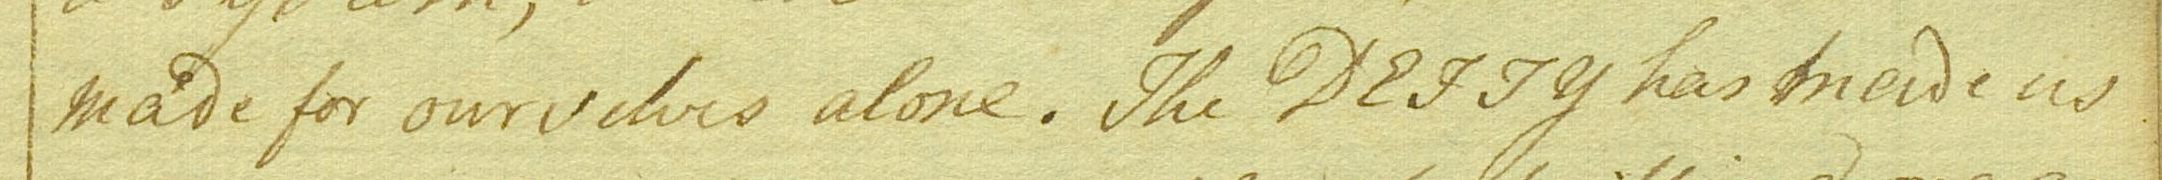made for ourselves alone. The DEITY has made us
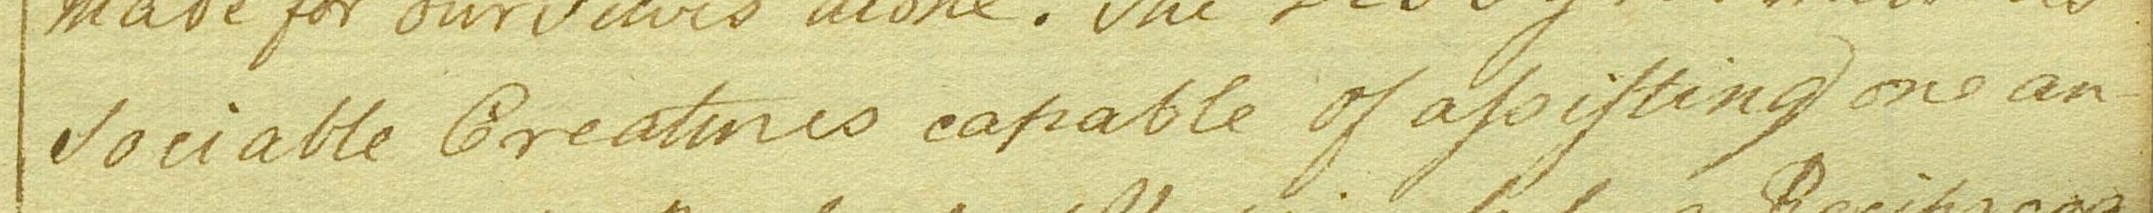sociable Creatures capable of assisting one an
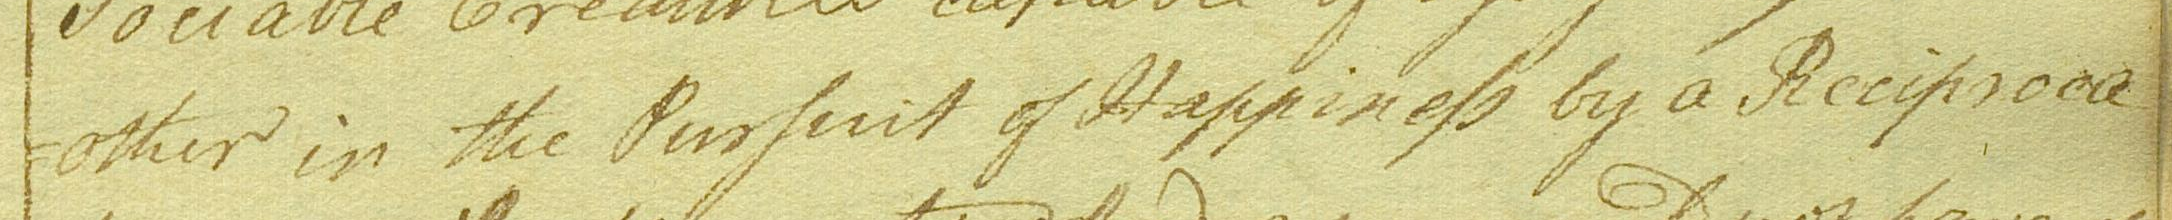-other in the Pursuit of Happiness by a Reciproca
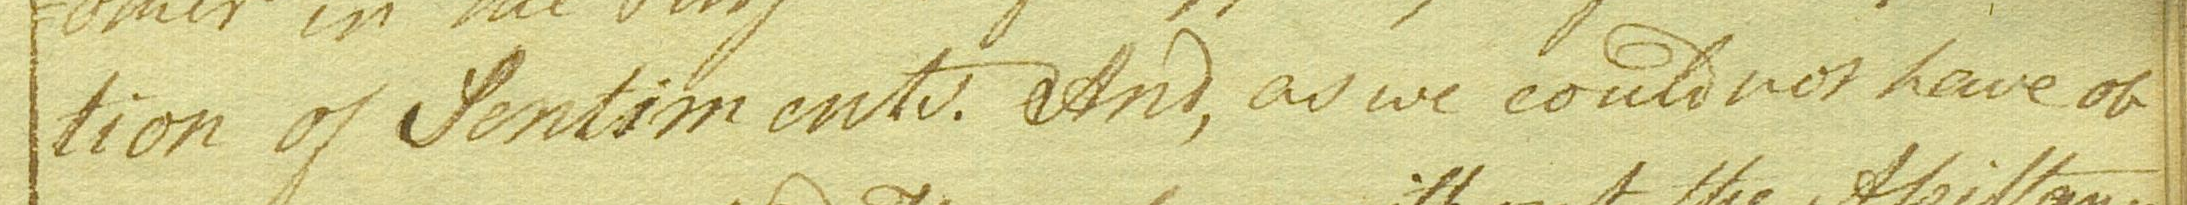tion of Sentiment. And, as we could not have ob-
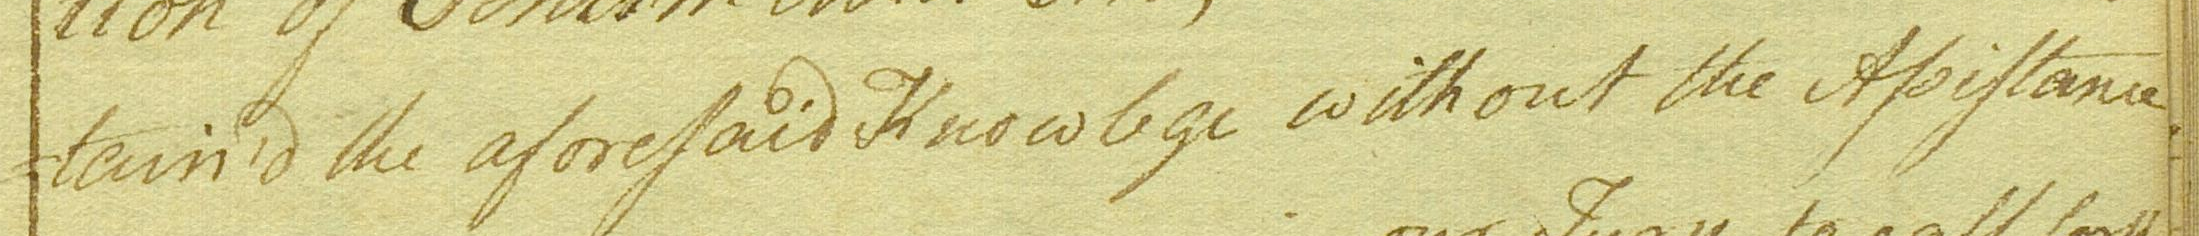-tain'd the aforesaid Knowledge without the Assistance
